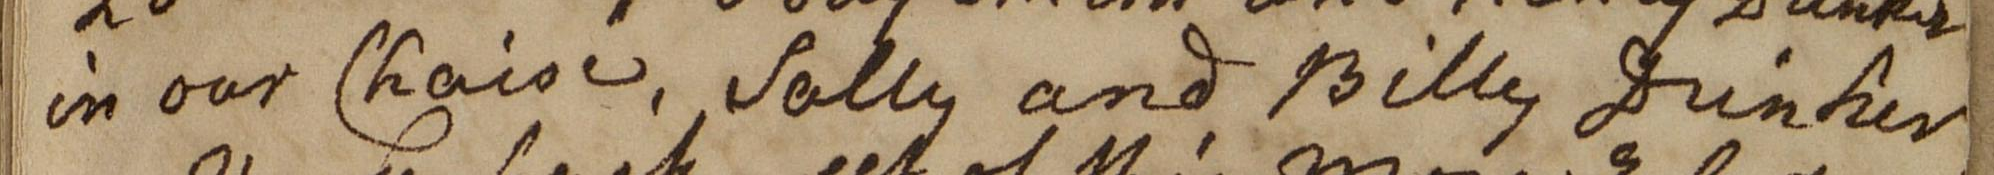in our Chaise, Sally and Billy Drinker
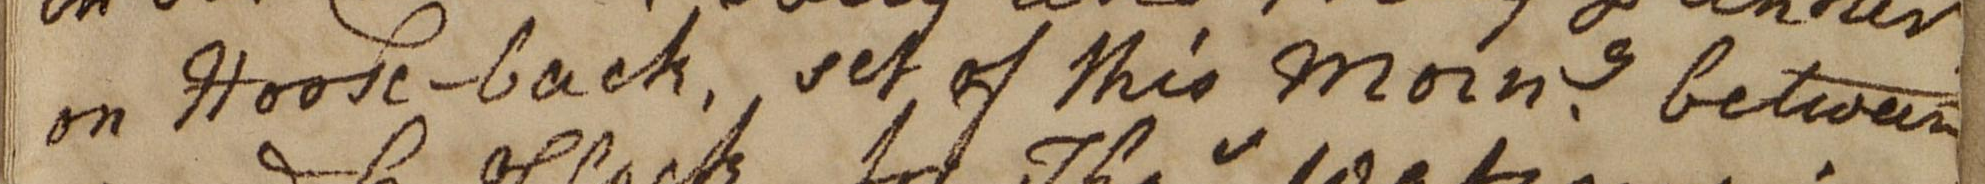on Hoose-back, set of this morn^g. between
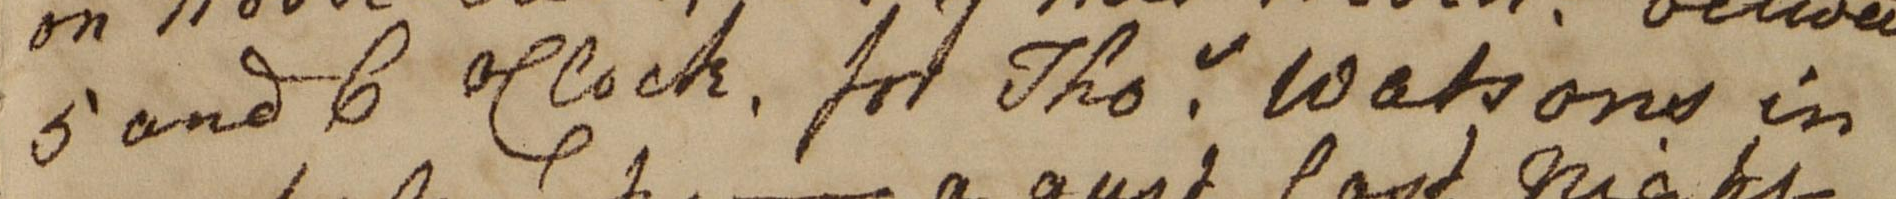5 and 6 ^o Clock, for Tho^s. Watsons in
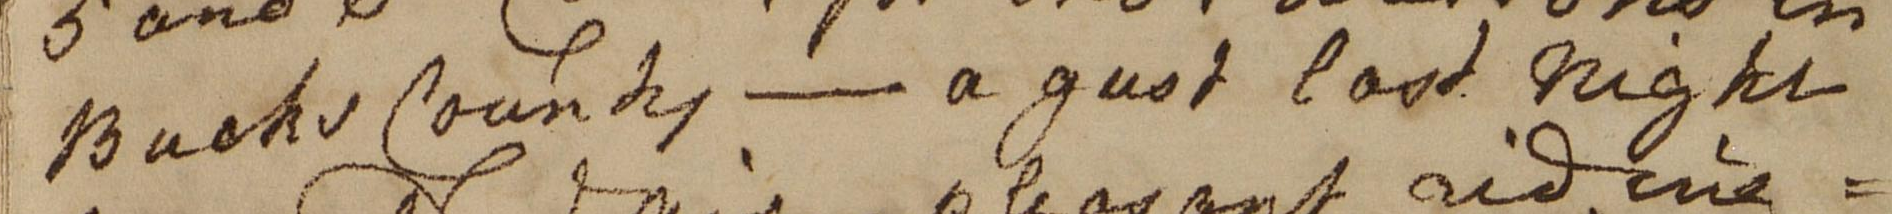Bucks County- a gust last night
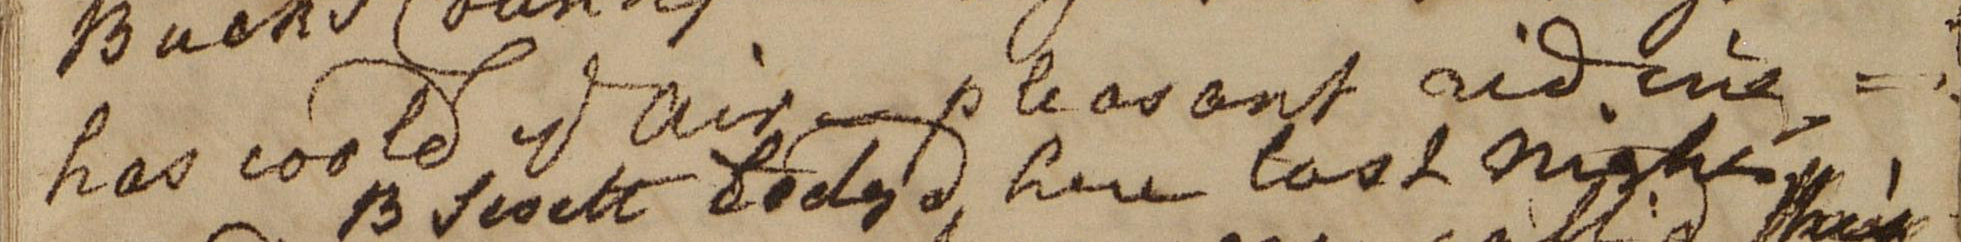has coold y^e Air,- pleasant riding-
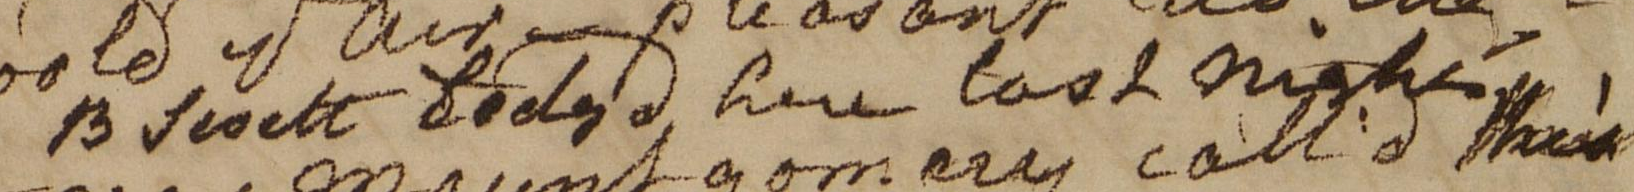B Sisett lodg'd here last night
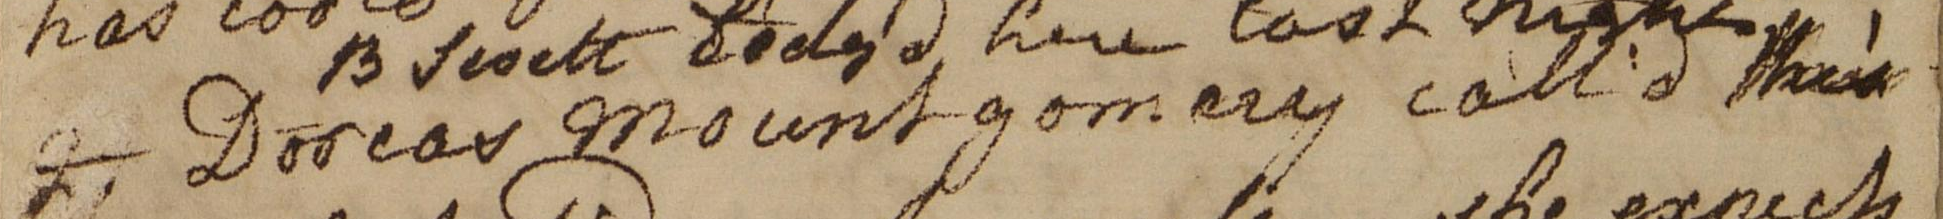21. Dorcas Mountgomery call'd this
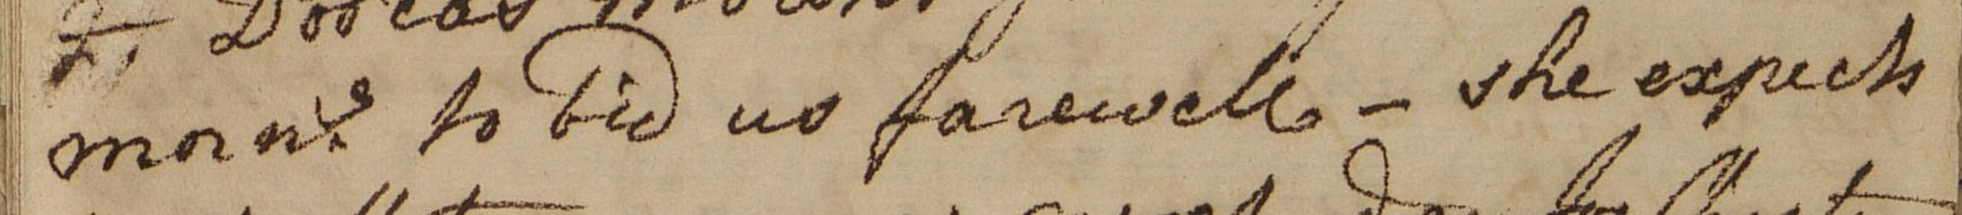morn^g to bid us farewell- she expects
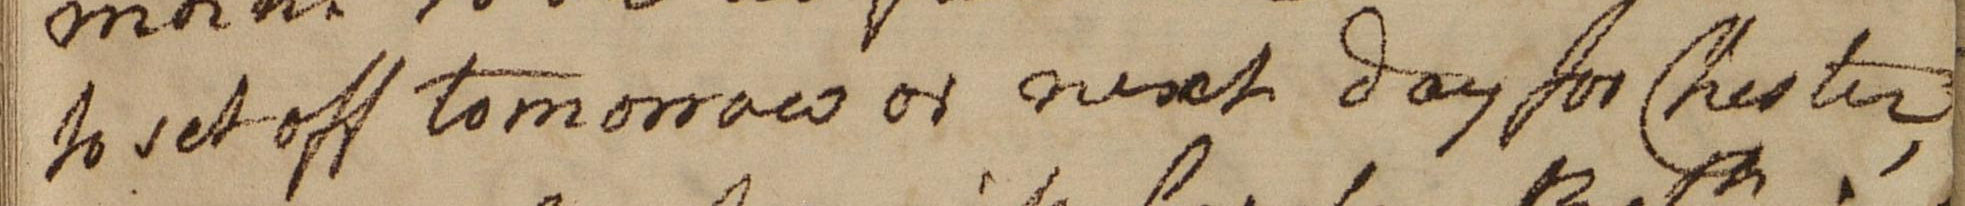to set off tomorrow or next day for Chester,
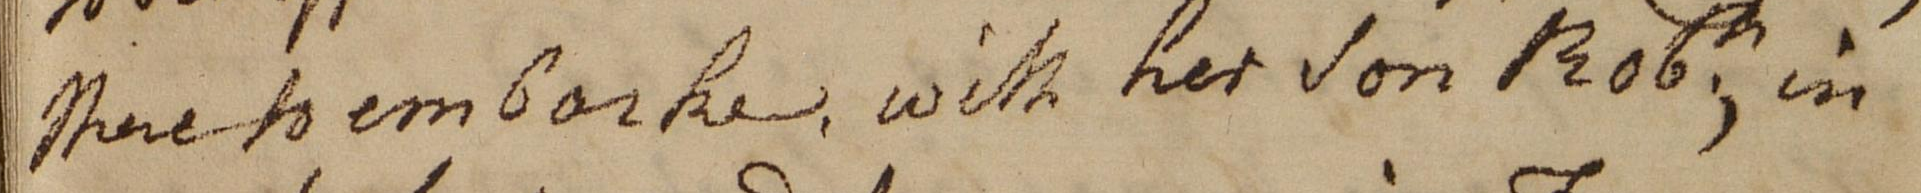there to embarke, with her son Rob^t, in
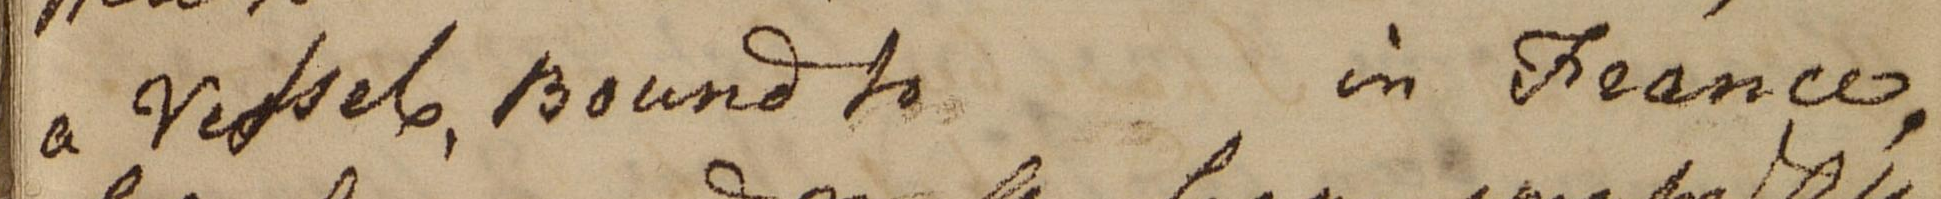a Vessel, Bound to in France,
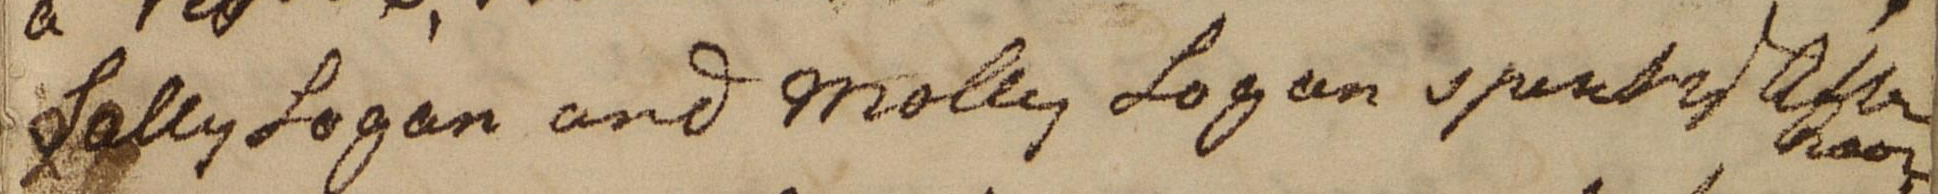Sally Logan and Molly Logan spent y^e After
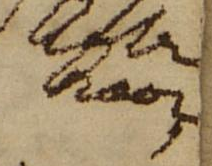noon
